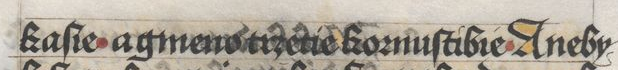kaſie a gmeno tizetie kornuſtibie. A neby¬
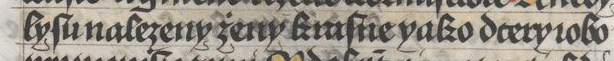lyſu nalezeny żeny kraſne yako dcery iobo¬
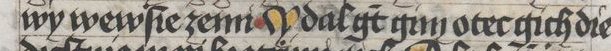wy we wẛie zemi.Y dal ḡt gim otec gich die¬
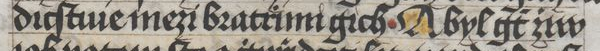dicſtwie mezi bratṙimi gich.A byl ḡt żiw
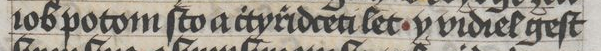iob potom ſto a ċtyṙidceti let.y vidiel geſt
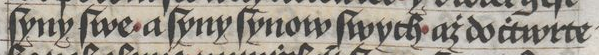ſyny ſwe.a ſuny ſynow ſwych.aż do ċtwrte¬
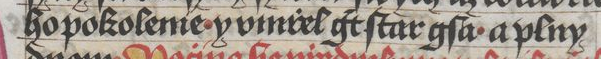ho pokolenie.y umṙel ḡt ſtar gſa.a plny
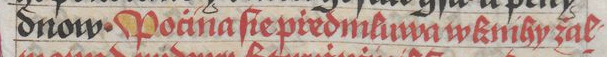dnow.Poċina ſie pṙedmluwa w knihy zal¬
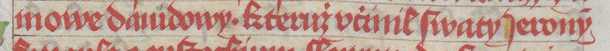mowe davidowy.kteruż uċinil ſwaty Ieronȳ
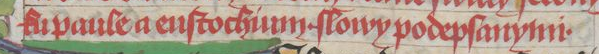ku paule a enſtochium.ſlowy podepſanymi.
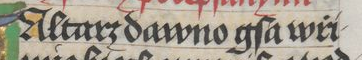Altarz dawno gſa wṙi¬
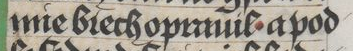mie biech oprauil.a pod¬
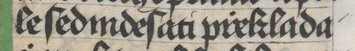le ſedmedeſati pṙeklada¬
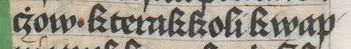cżow.kterakkoli kwap¬
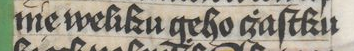nie weliku geho cżaſtku¬
